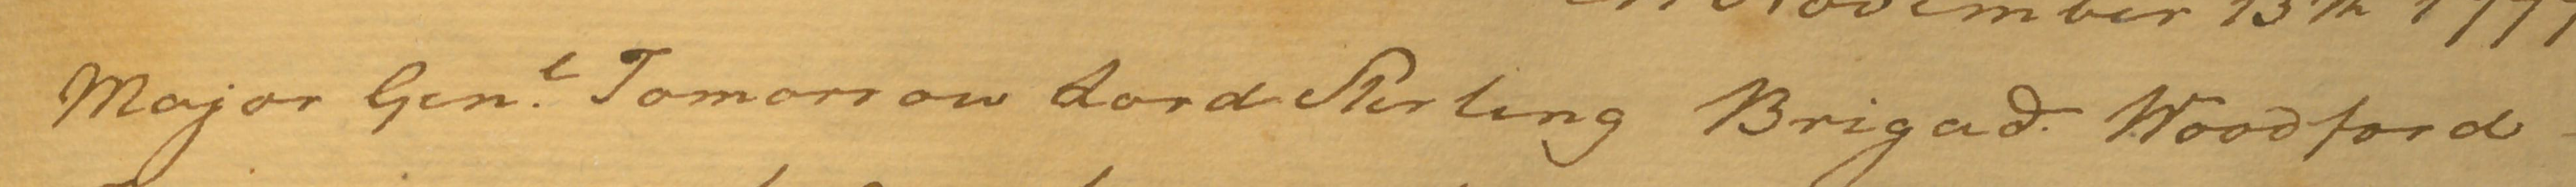Major Gen^l. Tomorrow Lord Sterling Brigad. Woodford
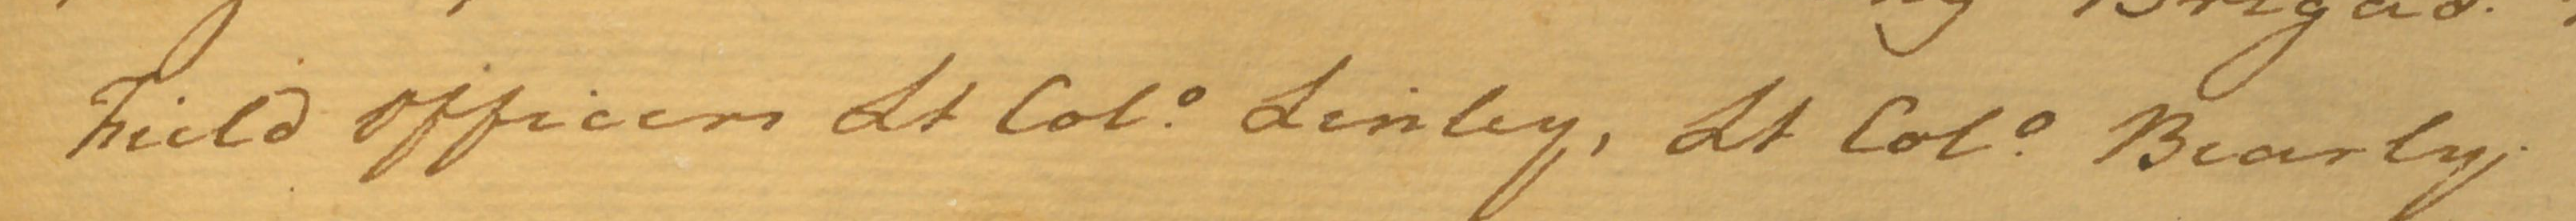Field Officers Lt Col^o. Linley, Lt CoL^o. Bearly
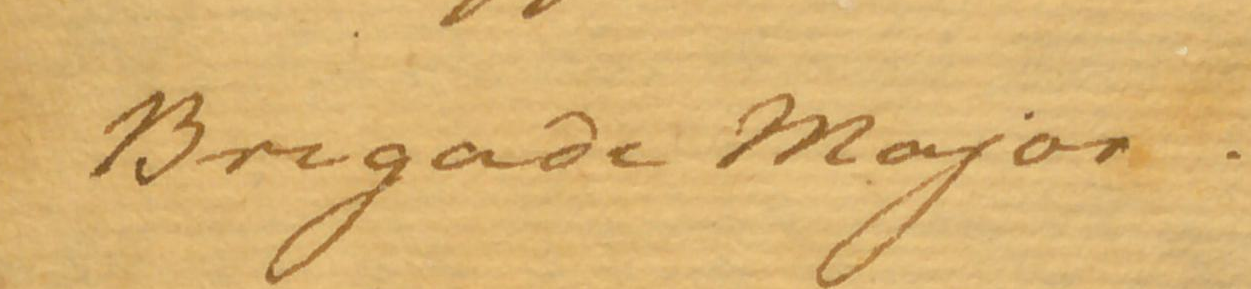Brigade Major
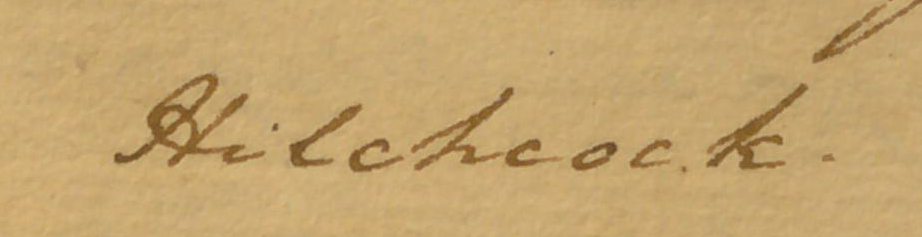Hitchcock.
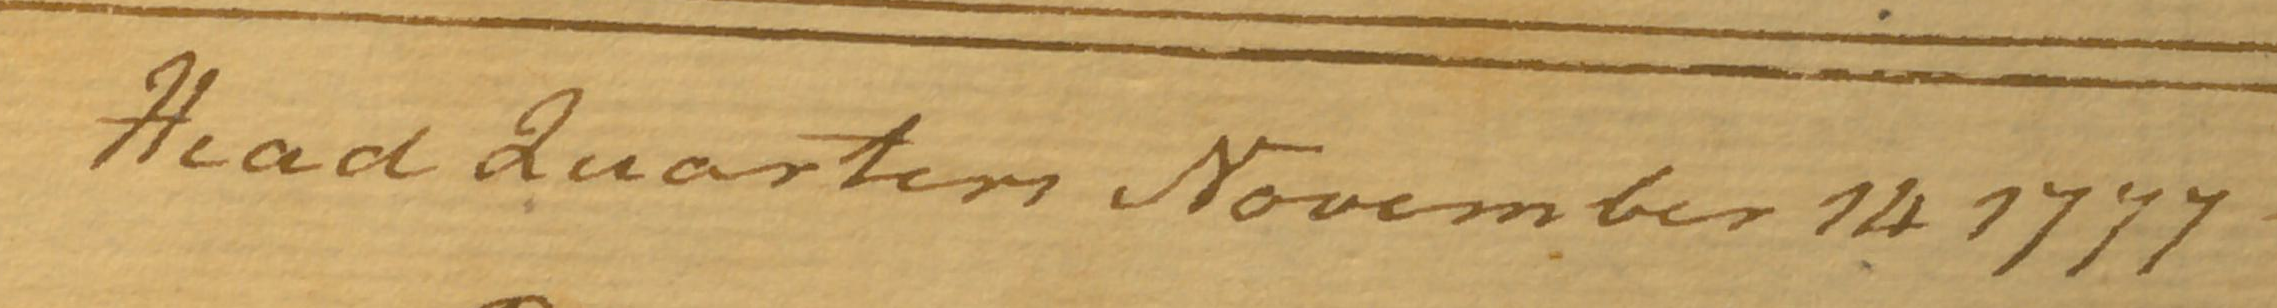Head Quarters November 14 1777
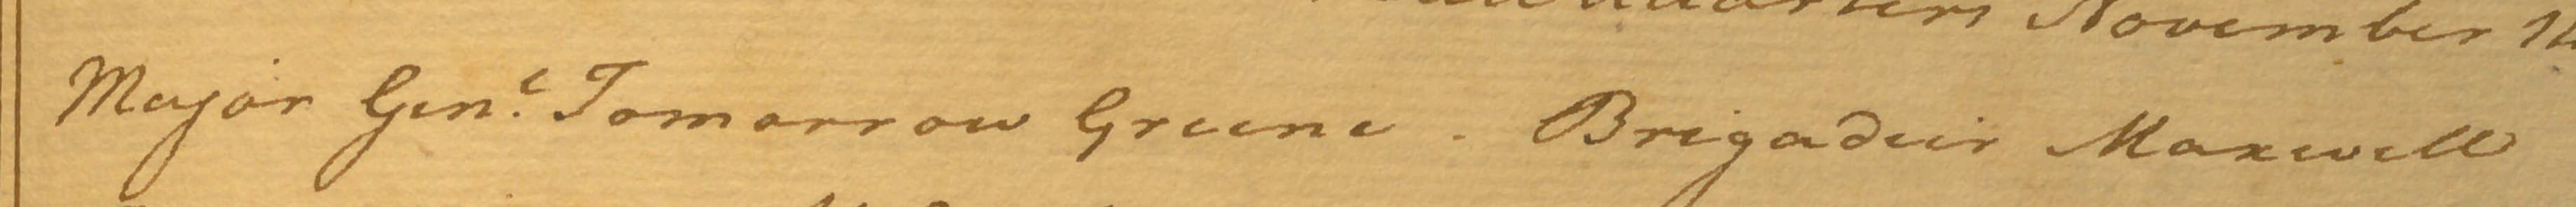Major Gen^l. Tomorrow Greene. Brigadier Maxwell
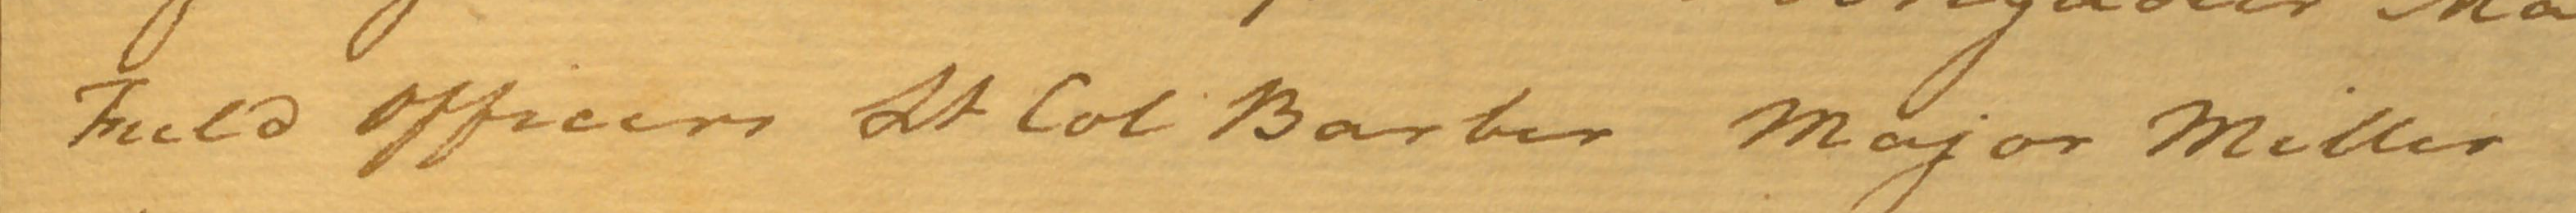Field Officers Lt Col Barber Major Miller
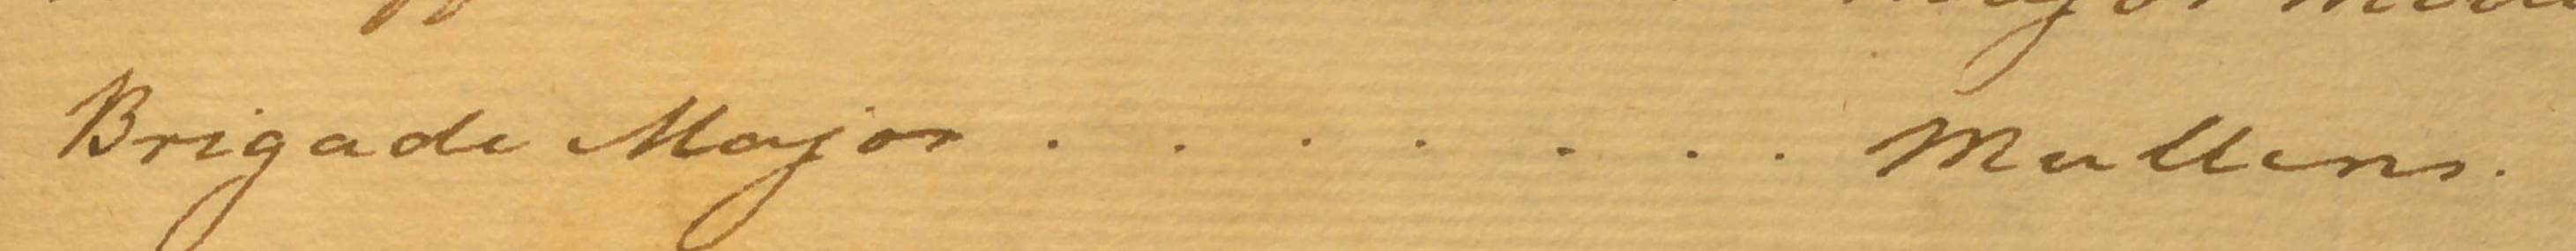Bragade Major ....... Mullens
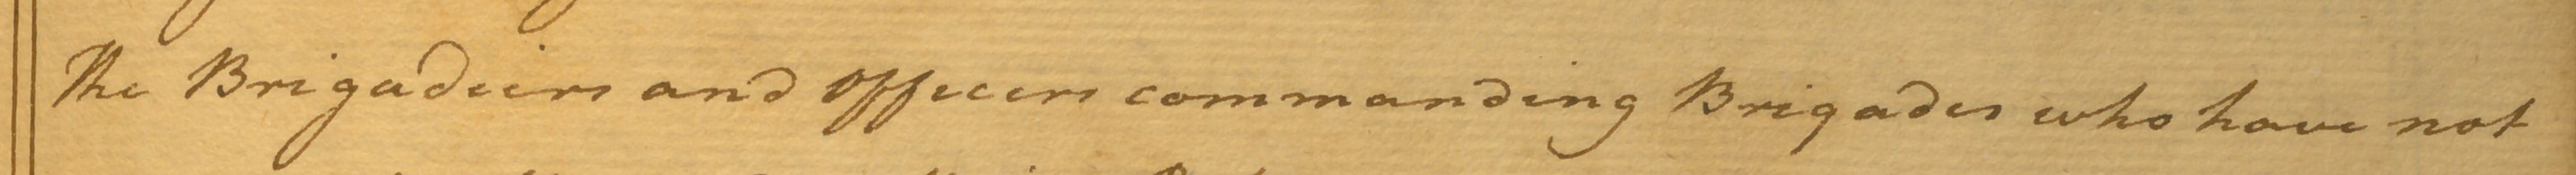The Brigadiers and Officers commanding Brigades who have not
